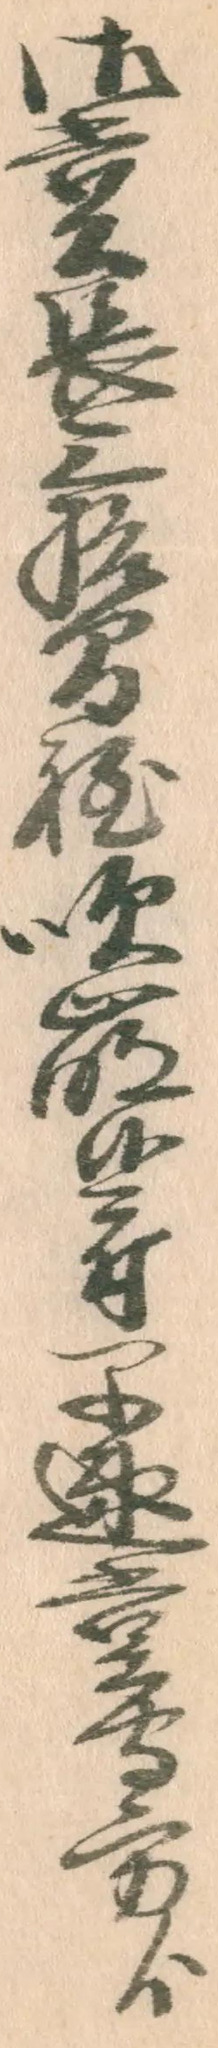御堂長三拾間程吹崩候ニ付早速堂守方ゟ
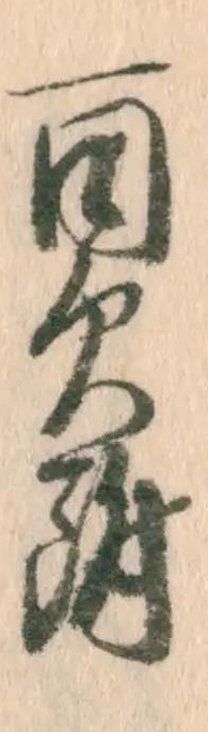一同欠附
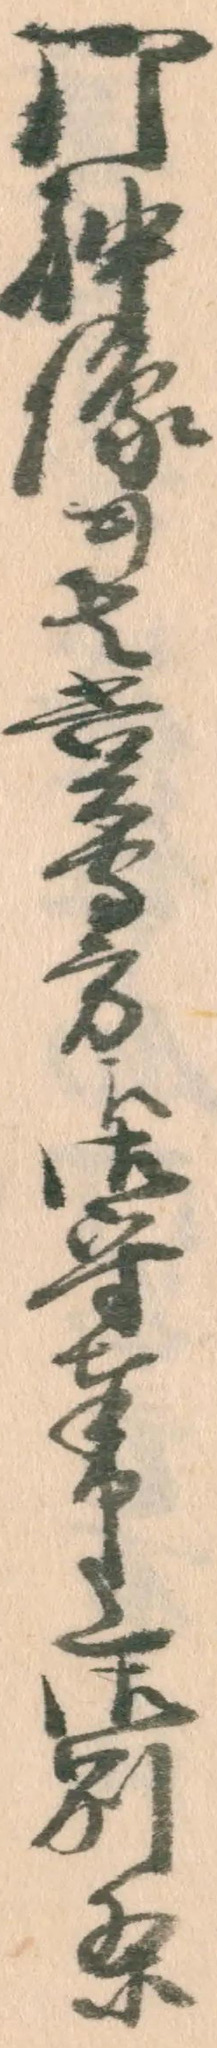御神像ヲ者堂守方江御守奉申上御別条
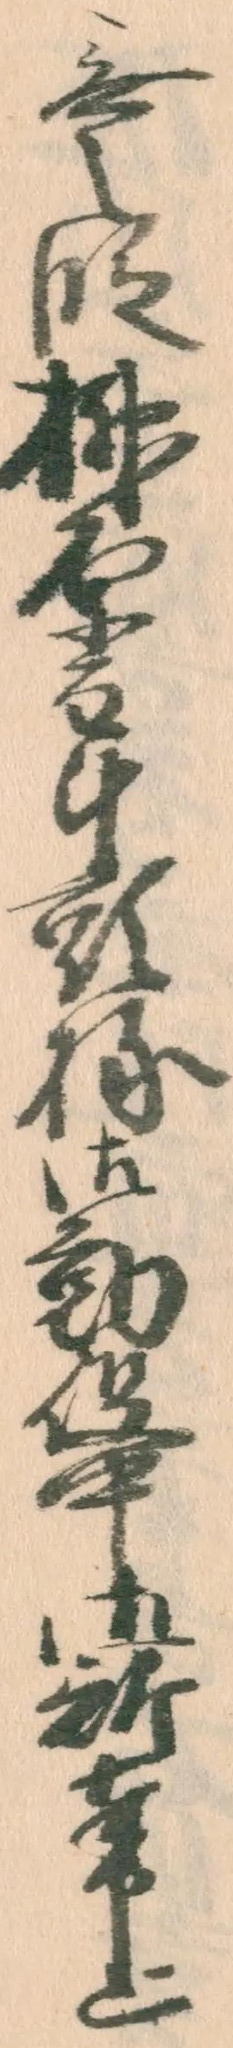無之段榊原主計頭様御勤役中御訴奉申上
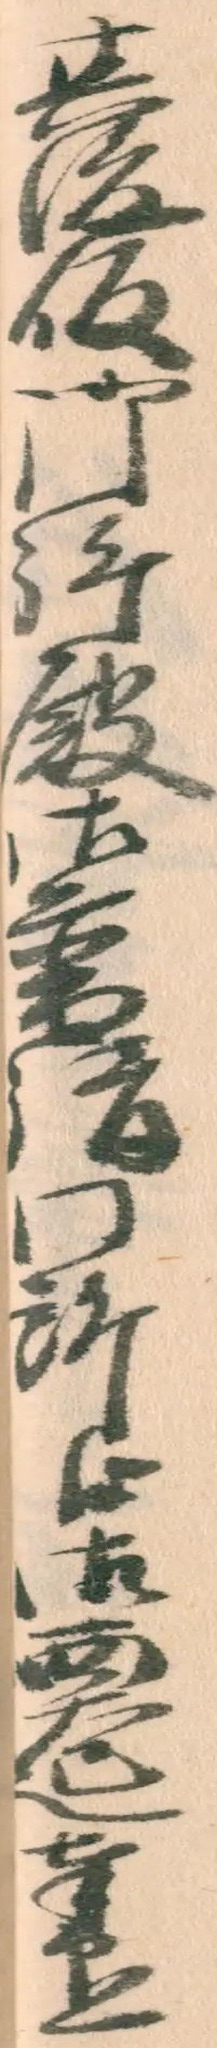其後仮御拝殿御普請同所江御遷奉申上
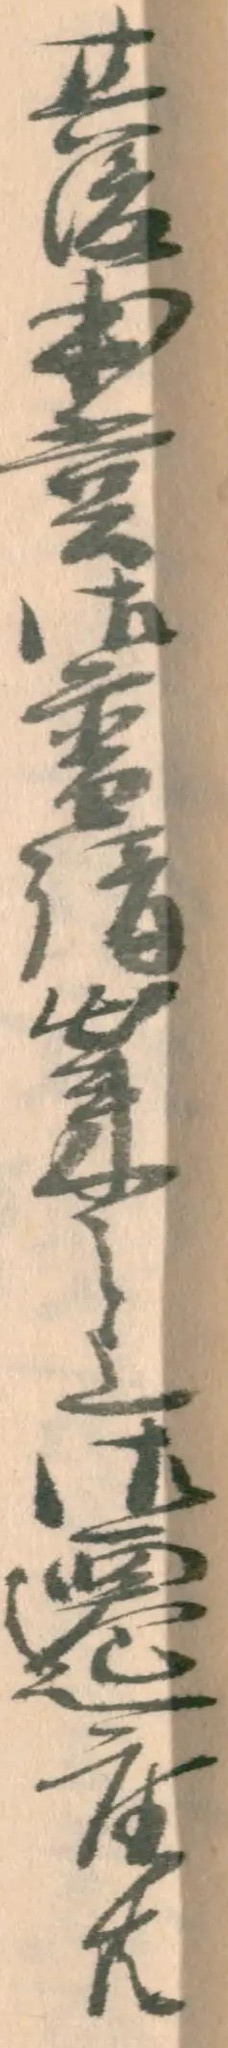其後本堂御普請出来申上御遷座共
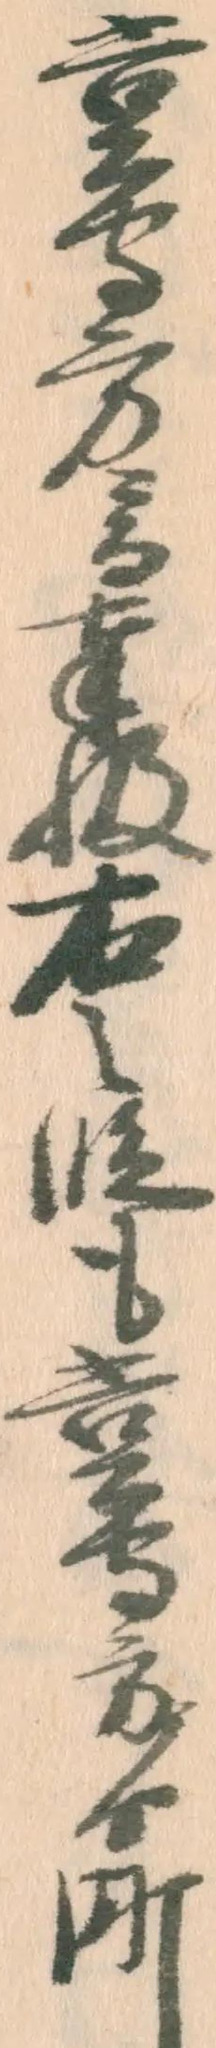堂守方ニ而奉扱右之段も堂守方ゟ町
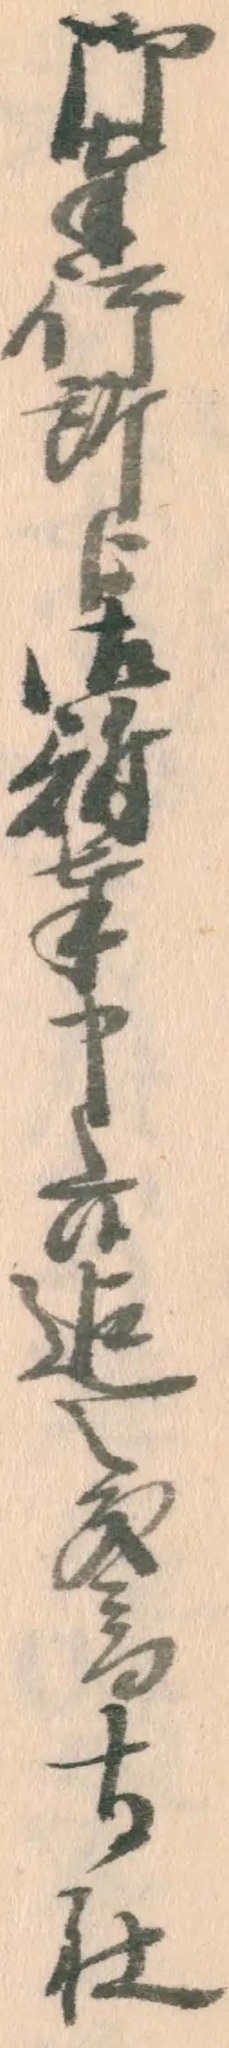御奉行所江御訴奉申上候迄之義ニ而寺社
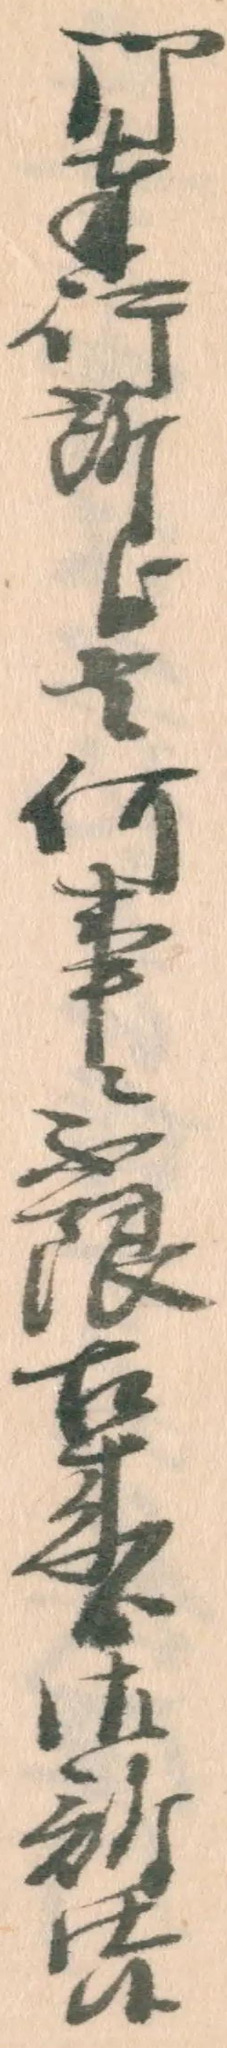御奉行所江者何事ニ不限古来ゟ御訴仕候
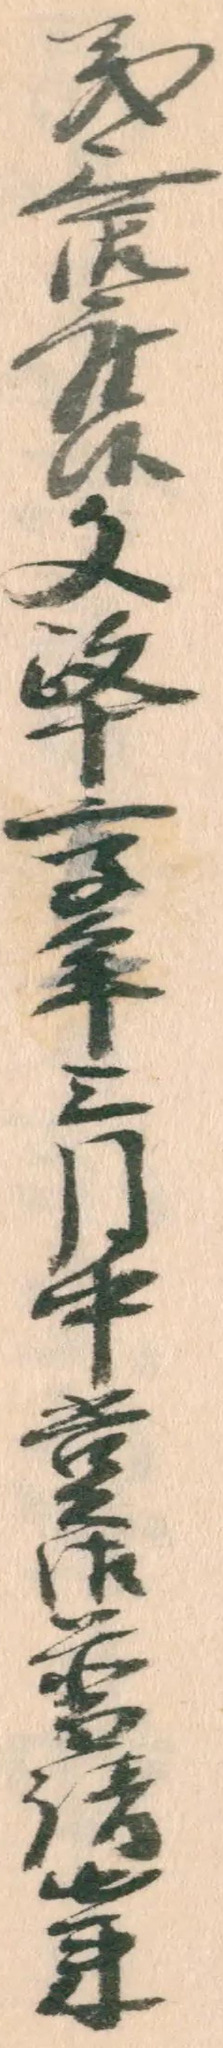義無御座候文政十一子年三月中堂御普請出来
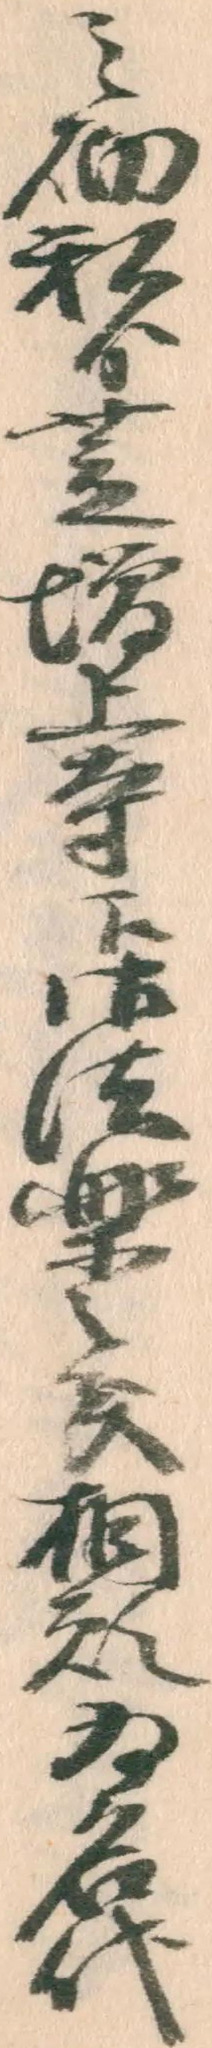之砌私ゟ芝増上寺江御法楽之義相願為名代

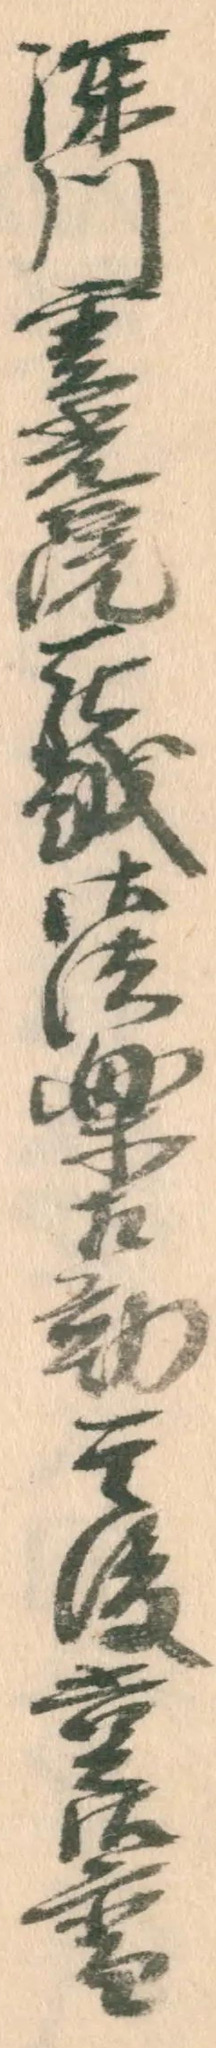深川雲光院罷越御法楽相勤其後堂御普
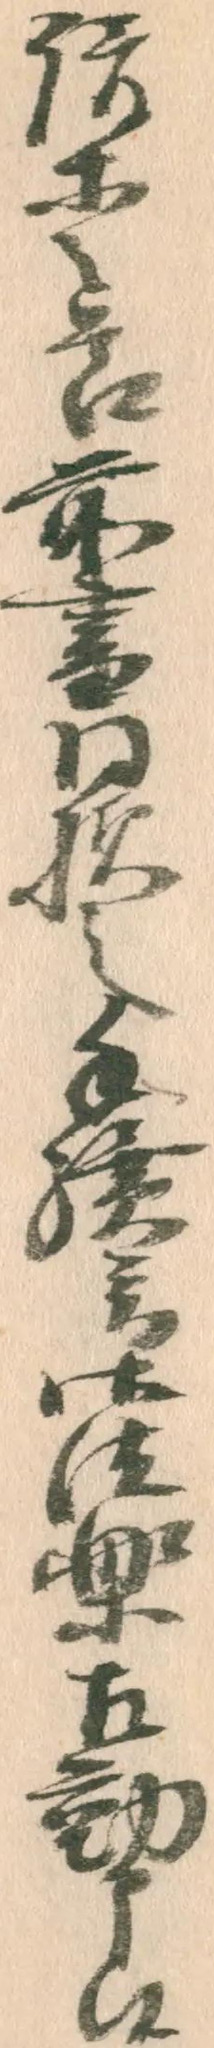請等之節前書同様之手続ニ而御法楽相勤申候
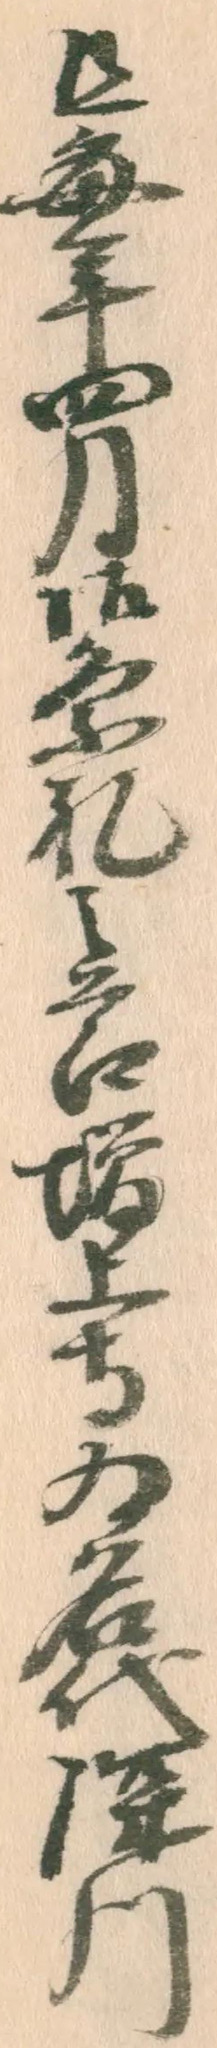且毎年四月御祭礼之節増上寺為名代深川
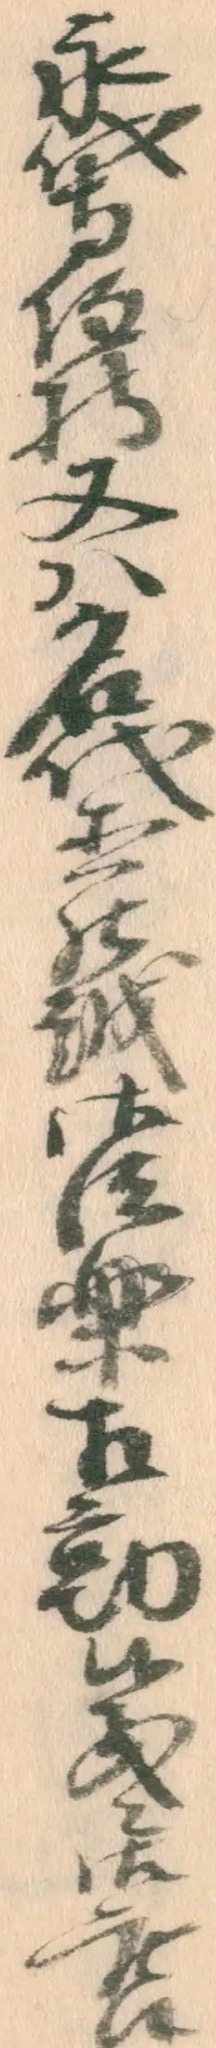永代寺住持又ハ名代等罷越御法楽相勤候義ニ御座候
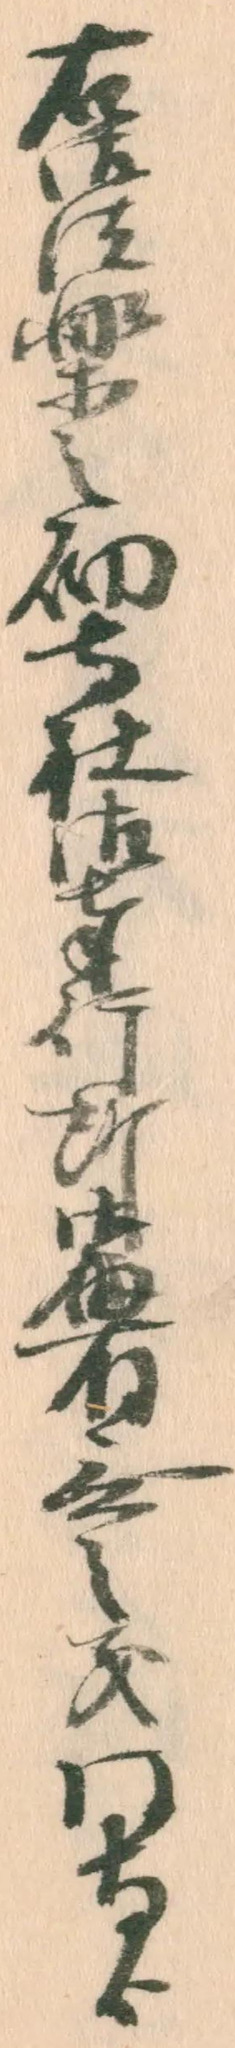右御法楽之砌寺社御奉行所御届有無之義同寺ゟ
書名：三十三間堂. [1]
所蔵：国立国会図書館 National Diet Library, JAPAN
